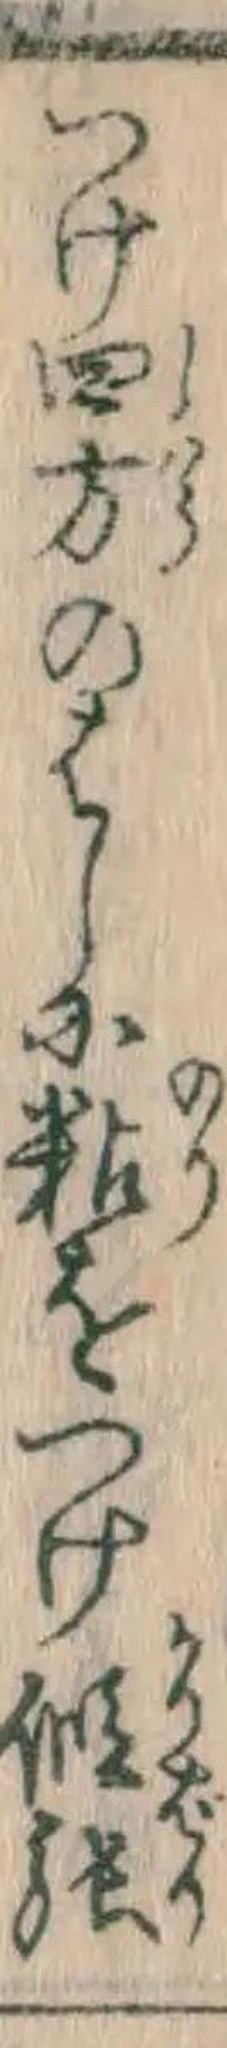つけ四方のはしに粘をつけ假張
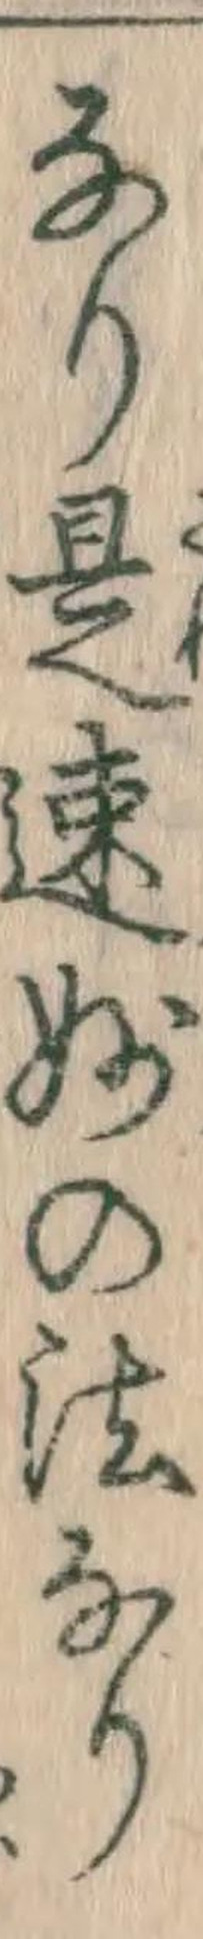なり是速妙の法なり
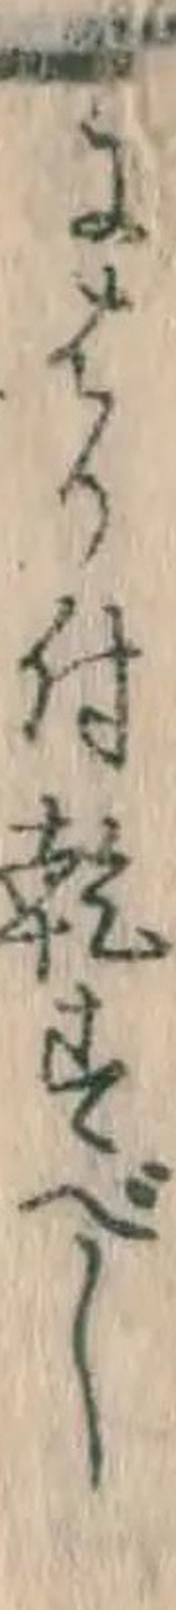にはり付乾すべし
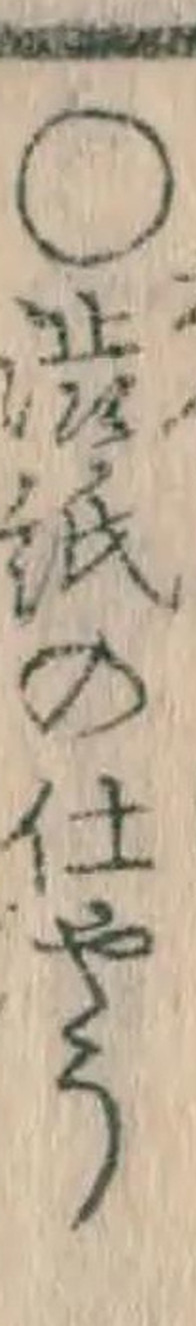○渋紙の仕やう
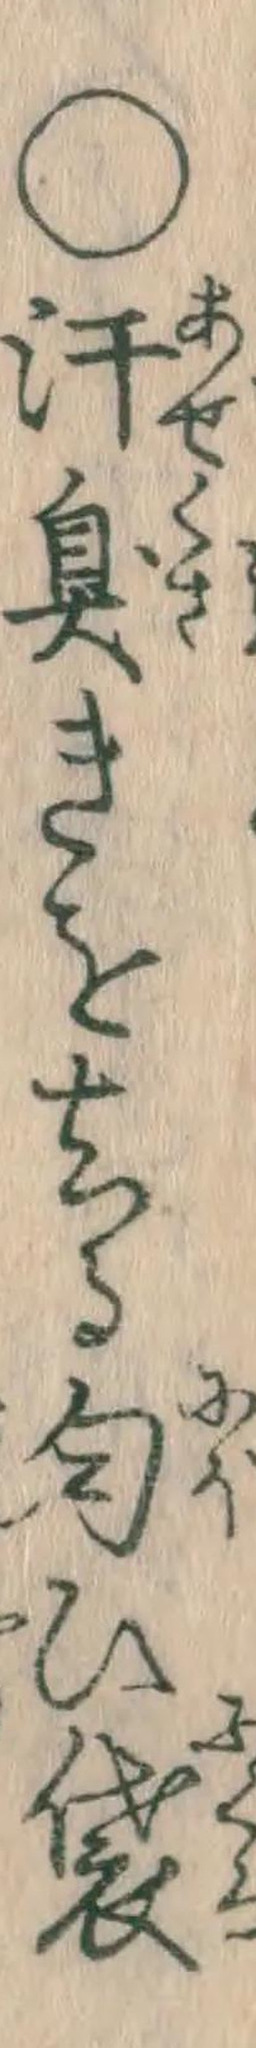○汗臭きを去る匂ひ袋
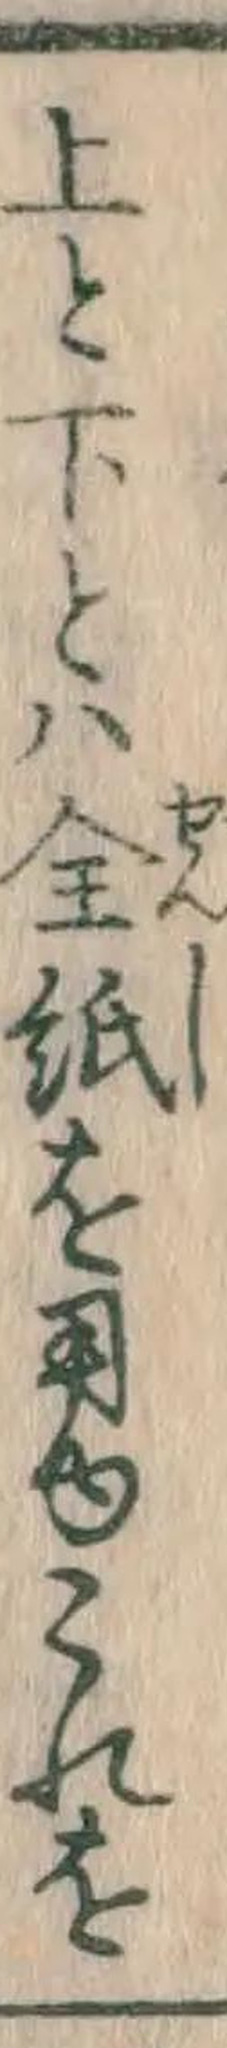上と下とは全紙を用ゆこれを
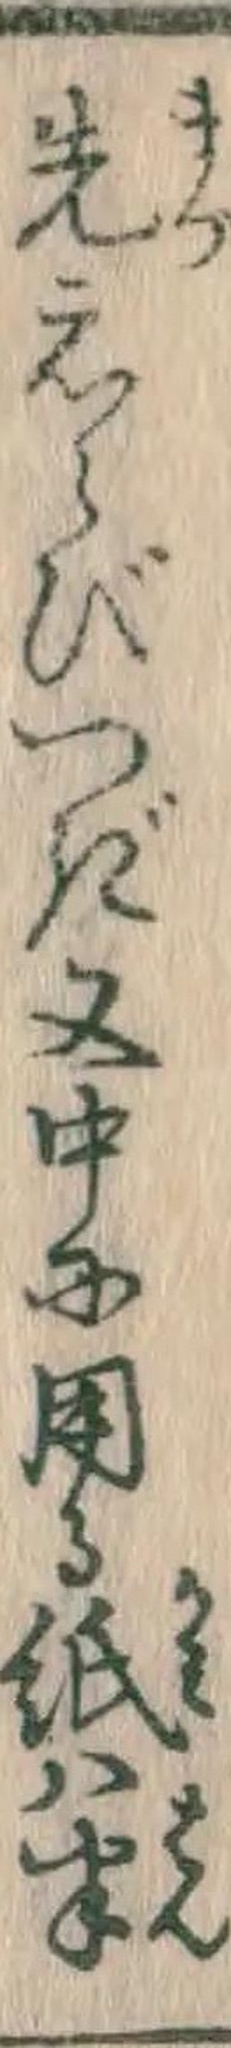先えらびつぎ又中に用る紙は半
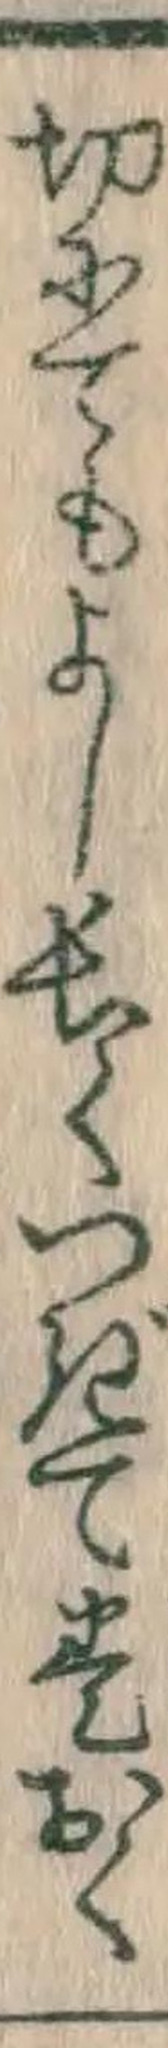切にてもよし長くつぎて巻おく
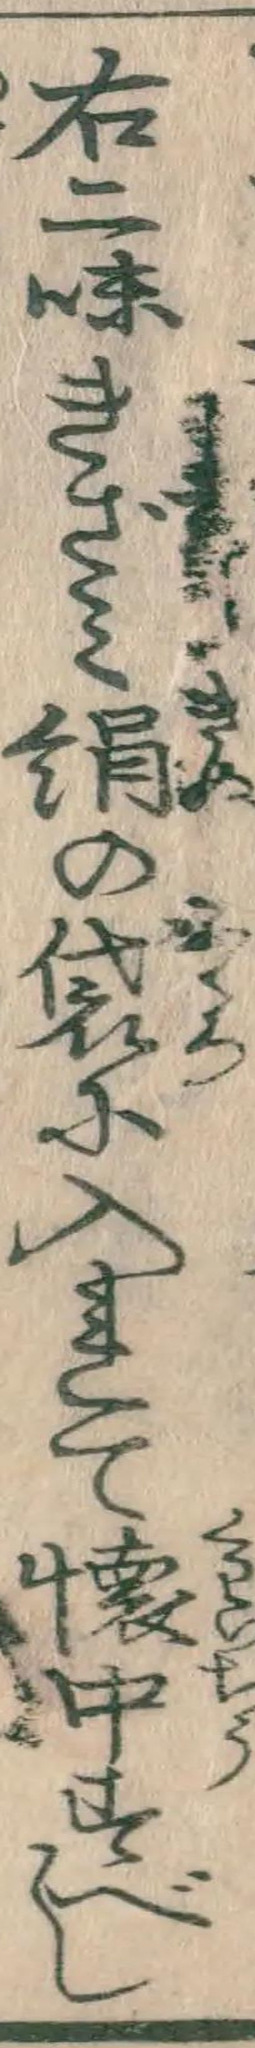右二味きざみ絹の袋に入れて懐中すべし
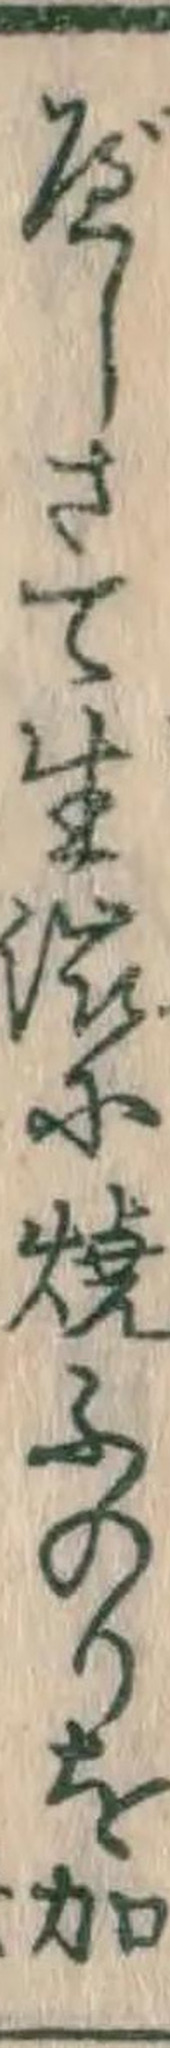べしさて生渋に焼ふのりを加
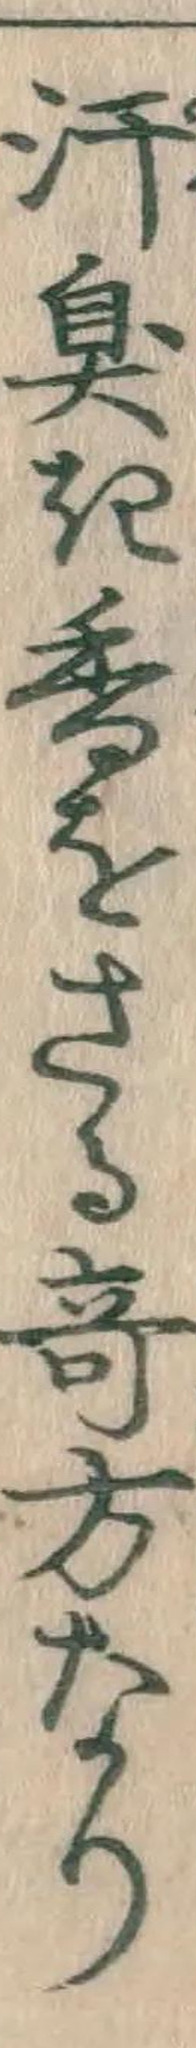汗臭き香をさる奇方なり
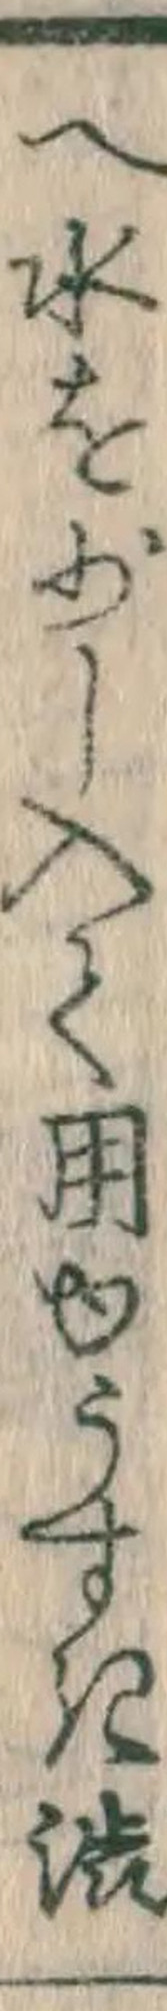へ水を少し入て用ゆうすき渋
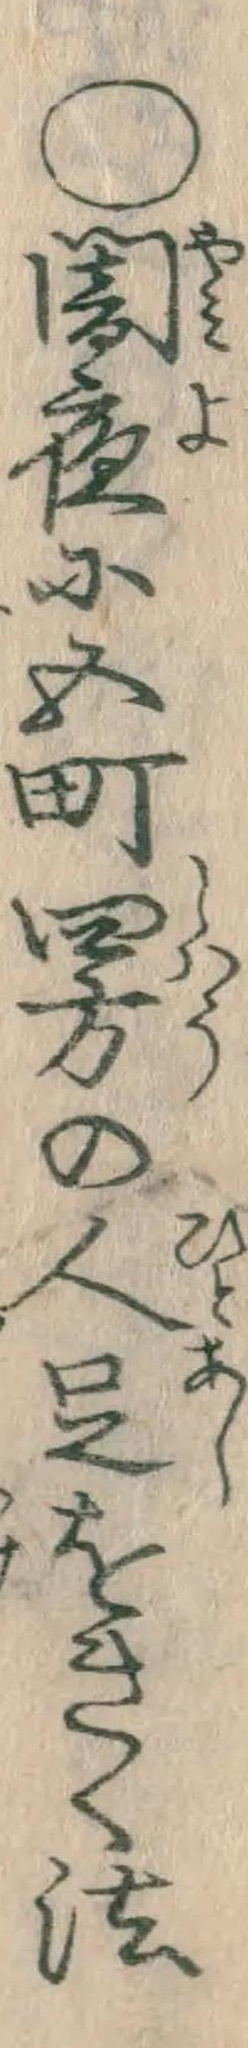○闇夜に五町四方の人足をきく法
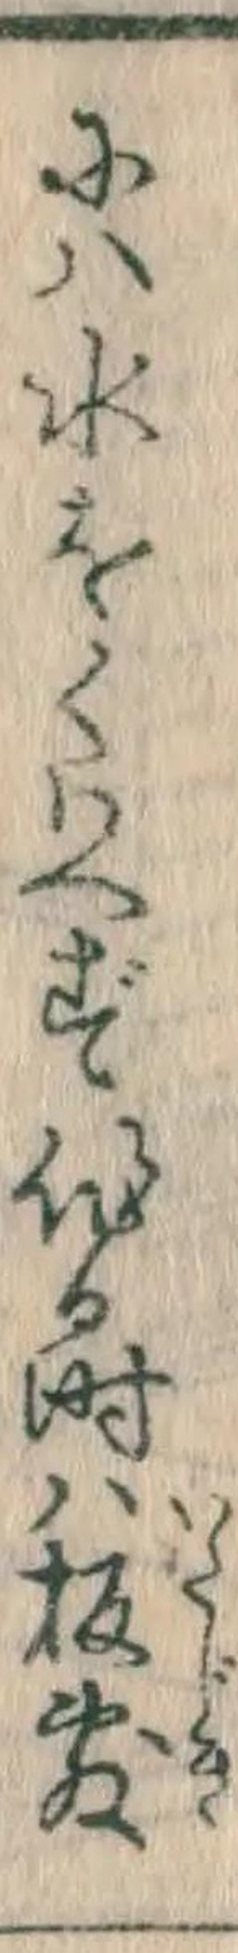には水をくはへず作る時は板敷
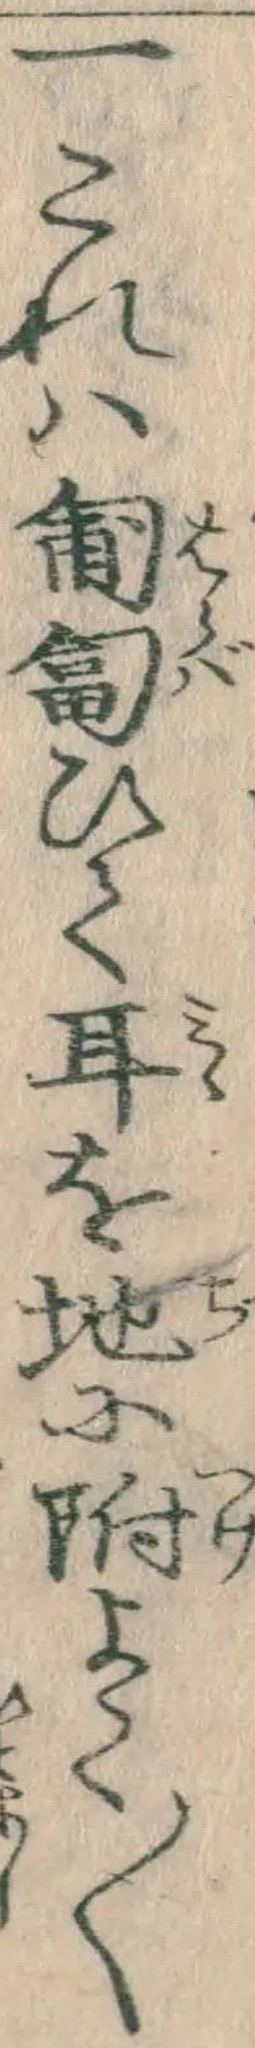一これは匍匐ひて耳を地に附よく〳〵
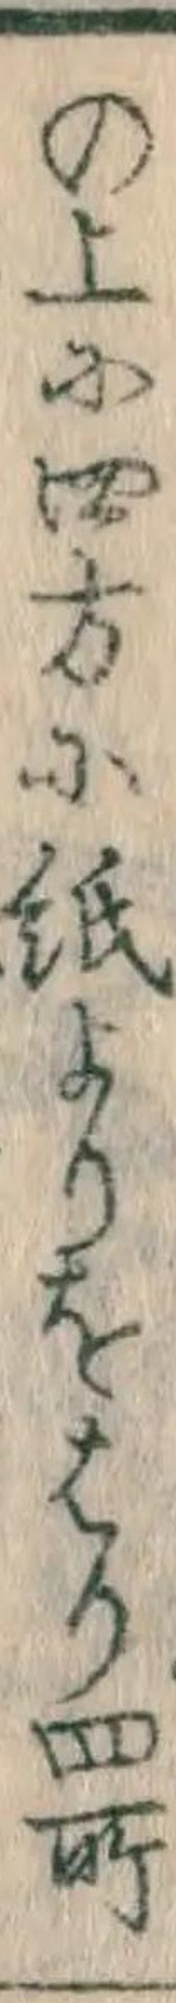の上に四方に紙よりをはり四所
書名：広益秘事大全 3巻. [2]
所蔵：国立国会図書館 National Diet Library, JAPAN
